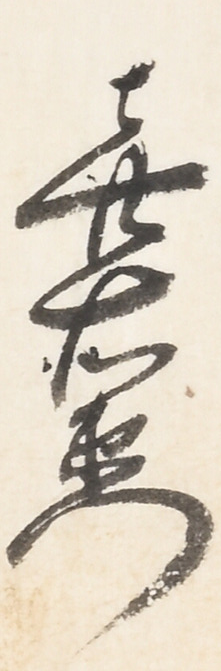喜右衛門
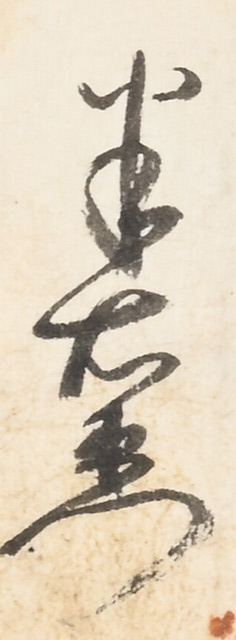半右衛門
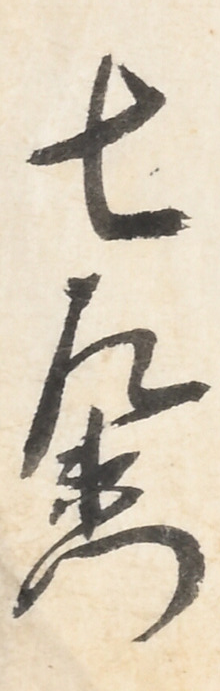七左衛門

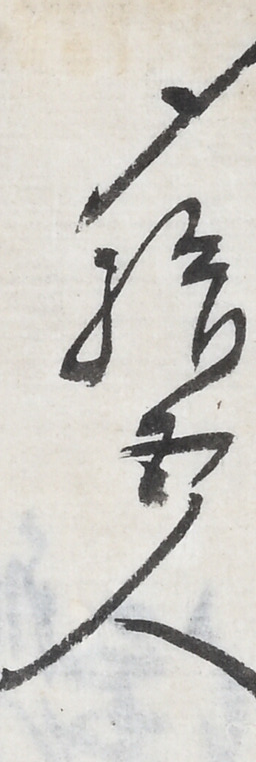〆拾五人
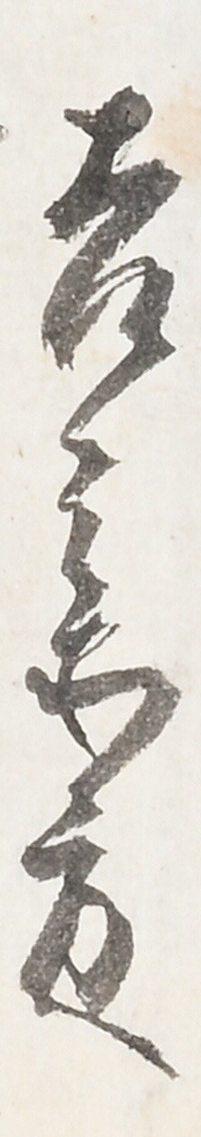吉兵衛方へ
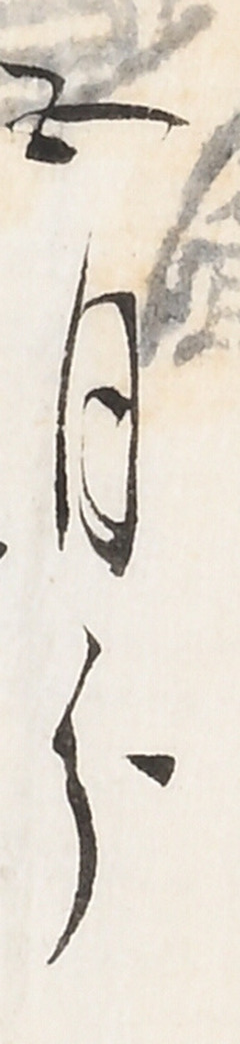五月分
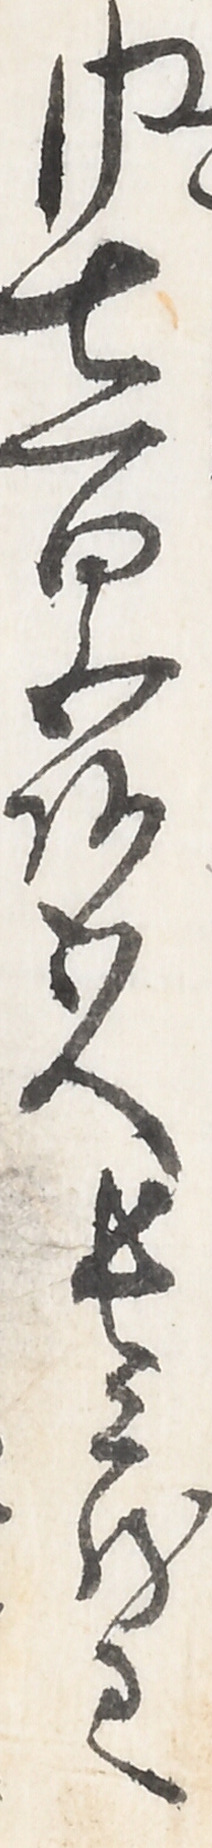内七百五拾五人文長蔵
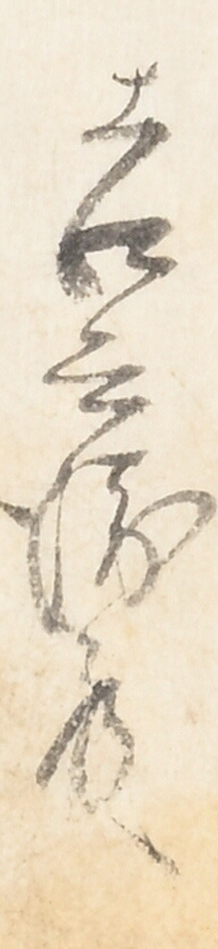吉兵衛方へ

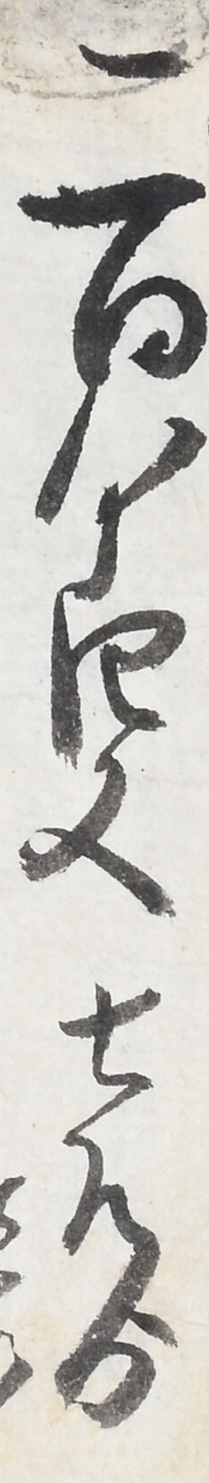一百八十四文七左衛門
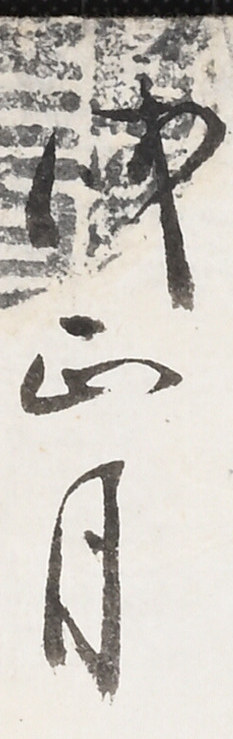戌正月
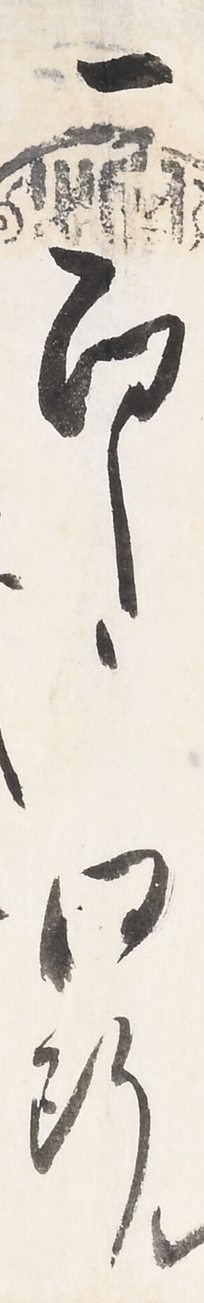一百文同断
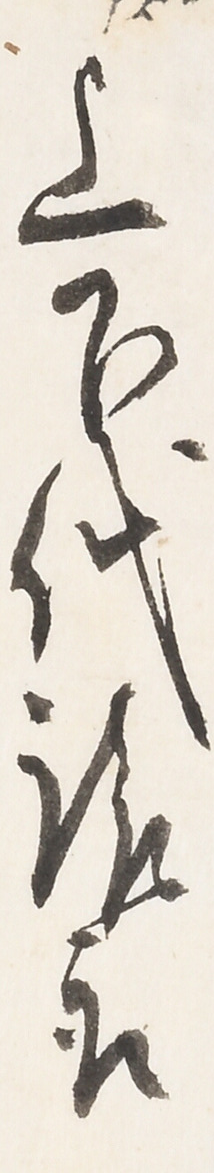上下代銀取
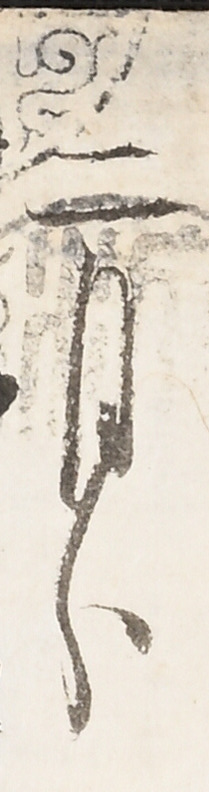戌正月
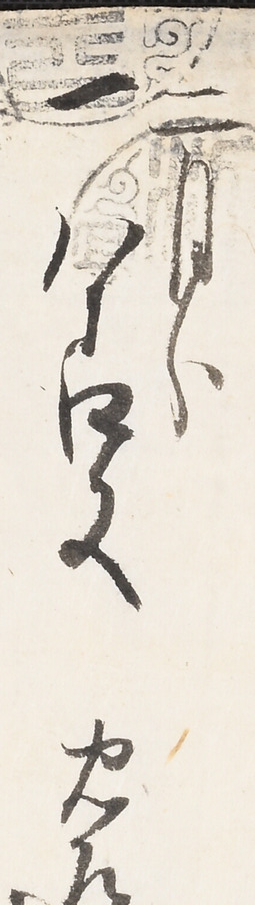一八十四文源右衛門
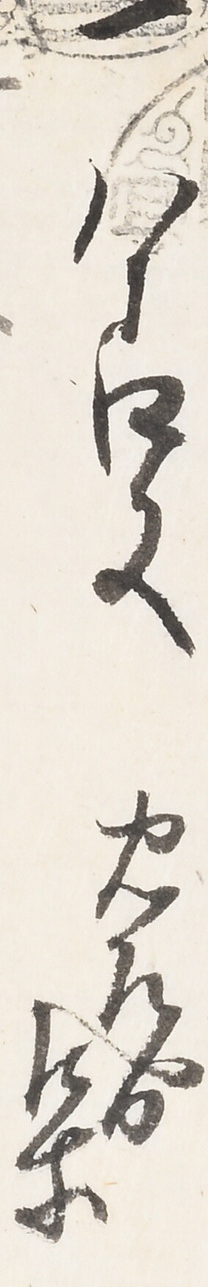一八十四文忠左衛門
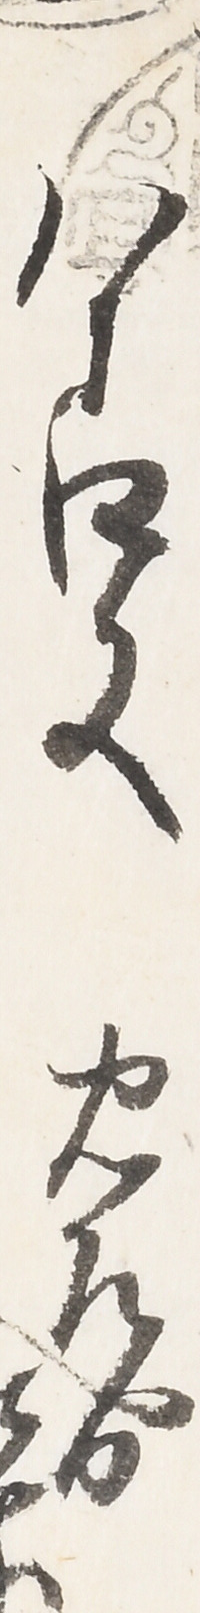一八十四文忠左衛門
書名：題目講月次出銭集帳
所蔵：伊那市立高遠町図書館・合同会社AMANE
